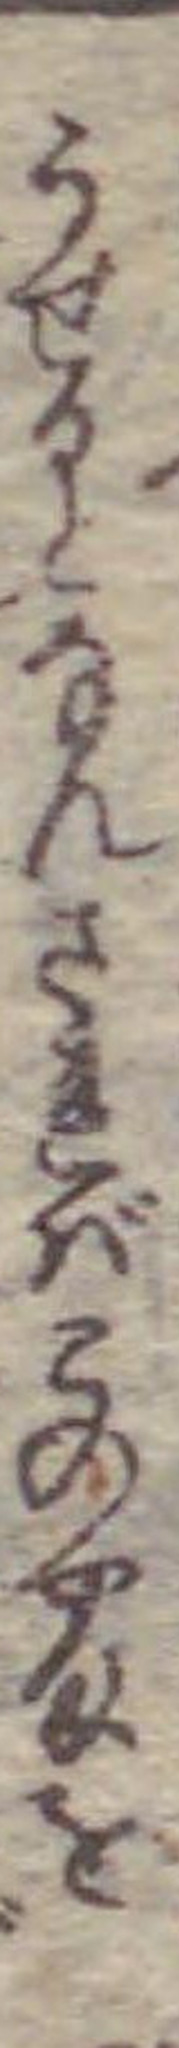うせるとなんさればこのやまを
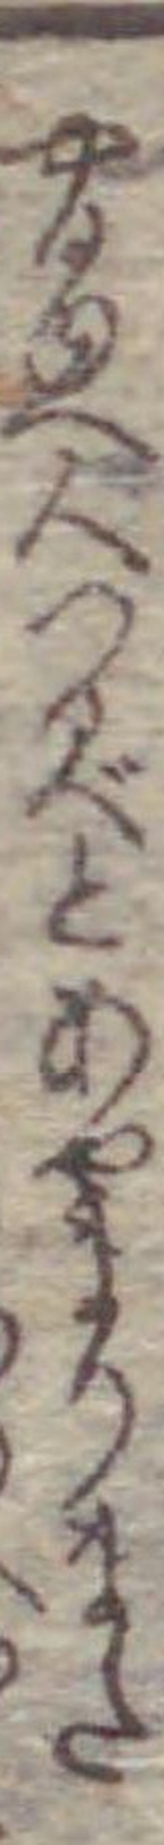やるゆへ人つるべとあやまりまた
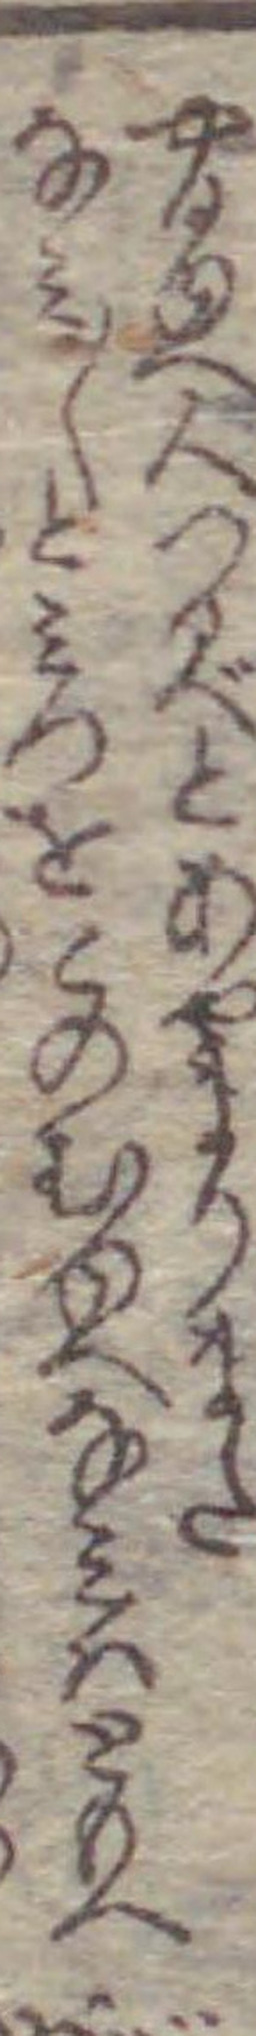なみ〳〵とみつをこのむゆへなみはともへ
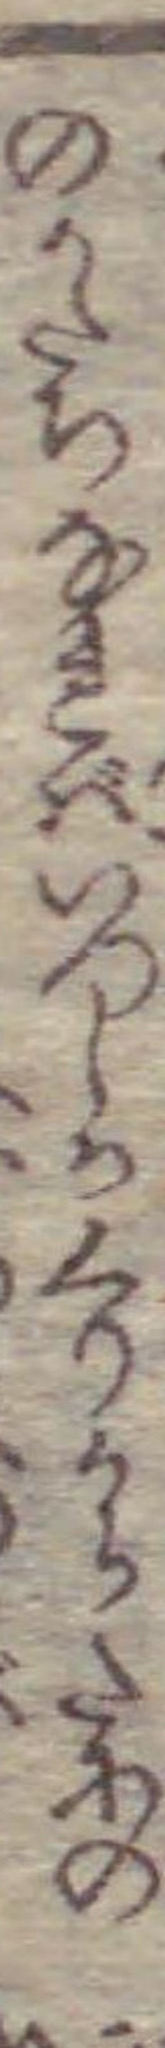のかたちなればいつしかくりからたにの
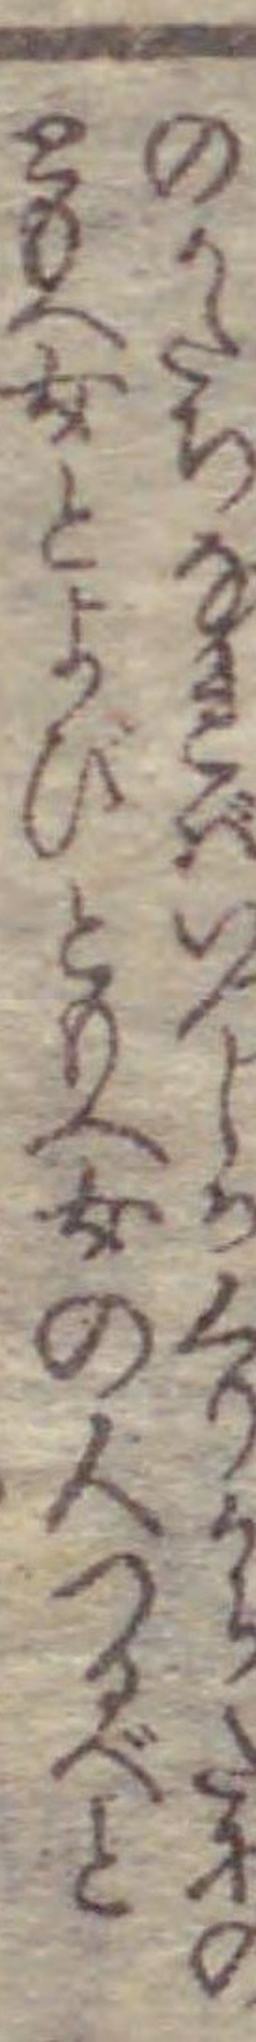ともへ女とよひともへ女の人つるべと
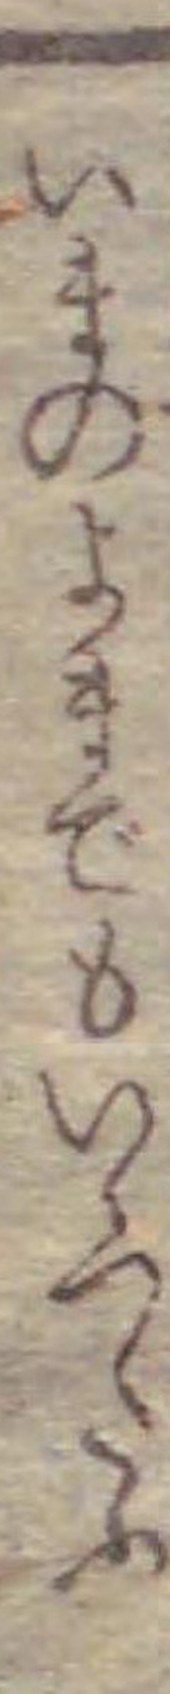いまの世までもいゝつたふ

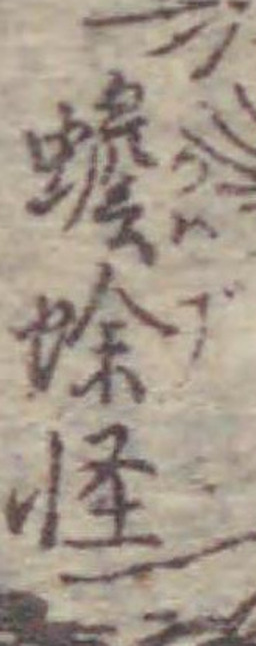蟾蜍怪
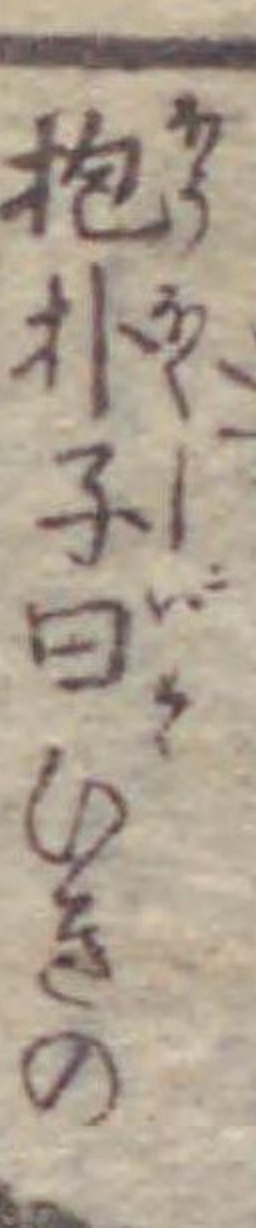抱朴子曰ひきの
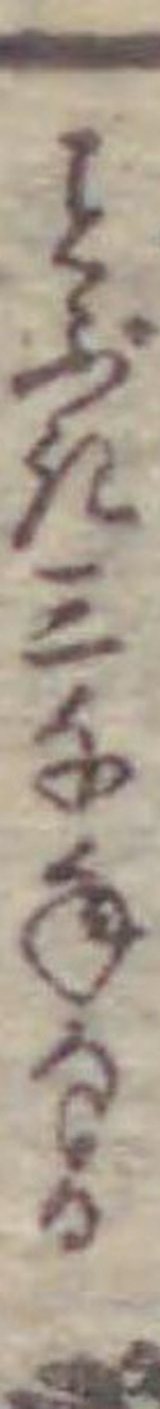ことぶき三千年なる
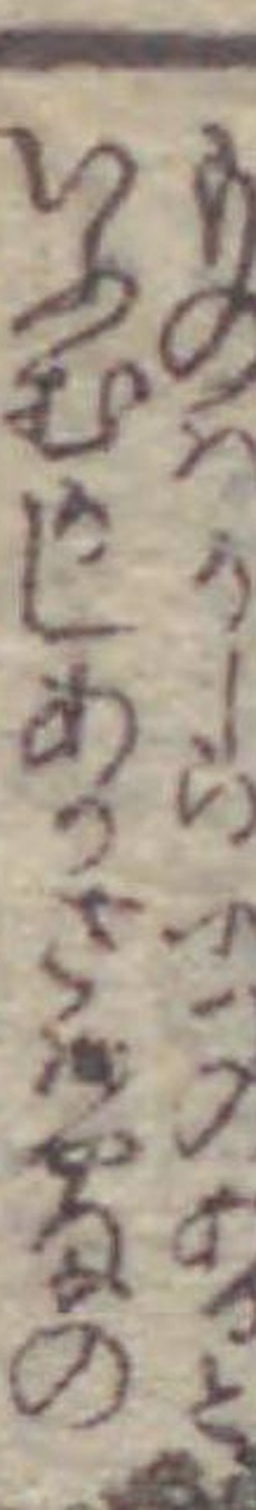いふむかしあかざはやまの
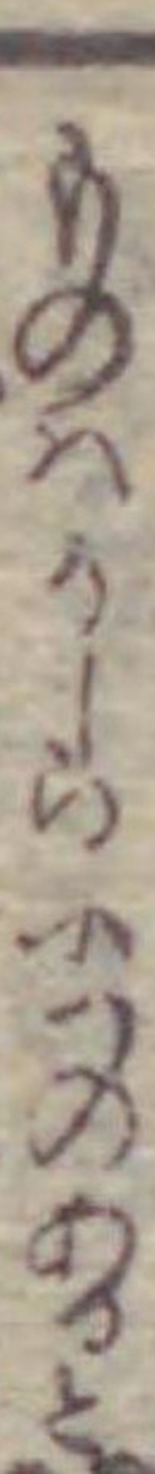ものはかしらにつのあると
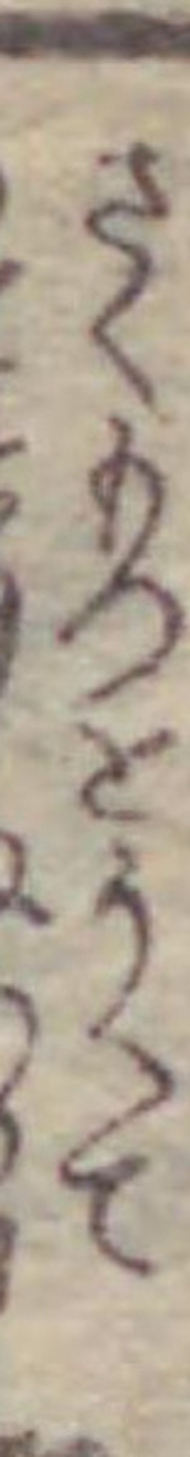さくもつをうへて
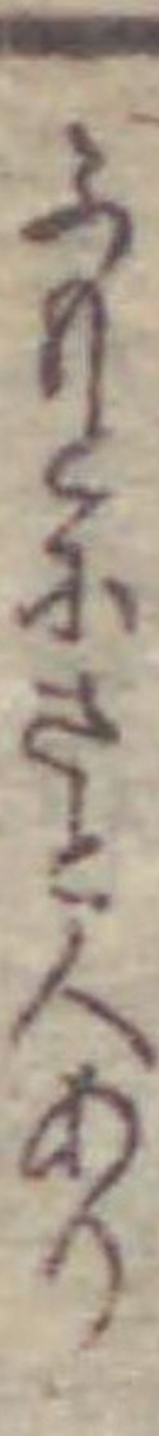ふもとにさと人あり
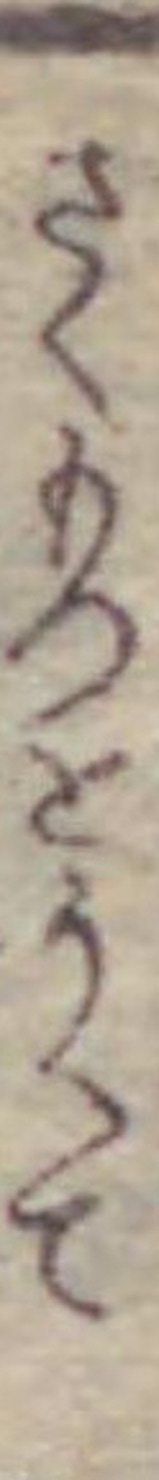さくもつをうへて
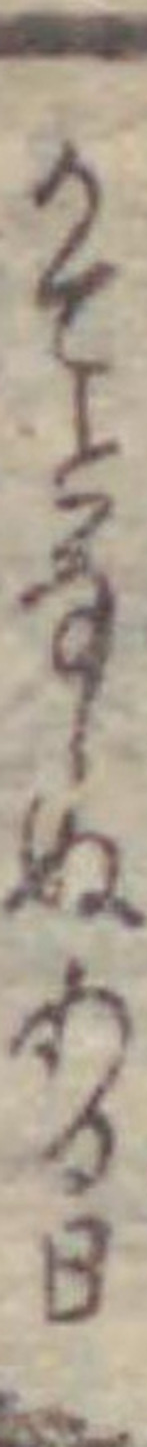かてとなしぬある日
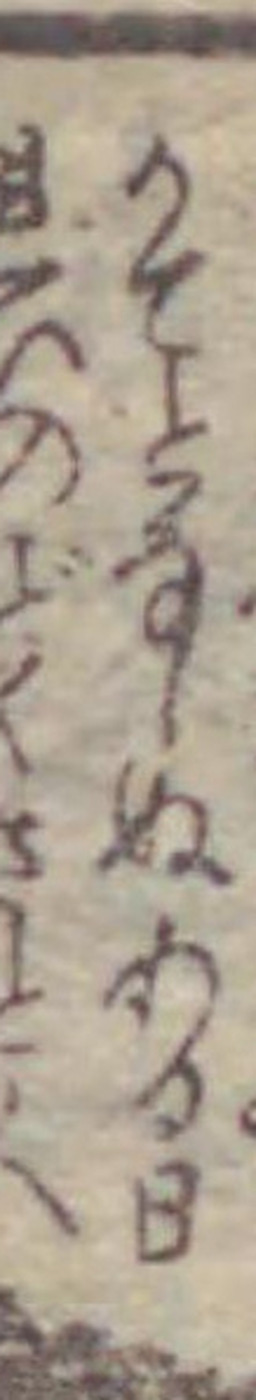れいのごとくさと人
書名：武家物奇談 : 3巻
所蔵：国立国会図書館 National Diet Library, JAPAN
